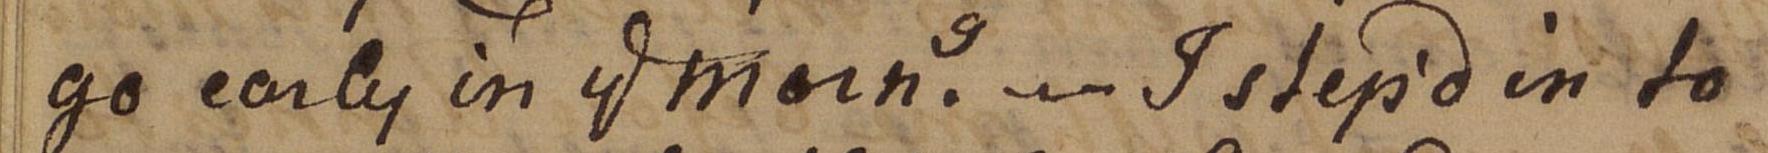go early in y^e Morn^g.- I step'd in to
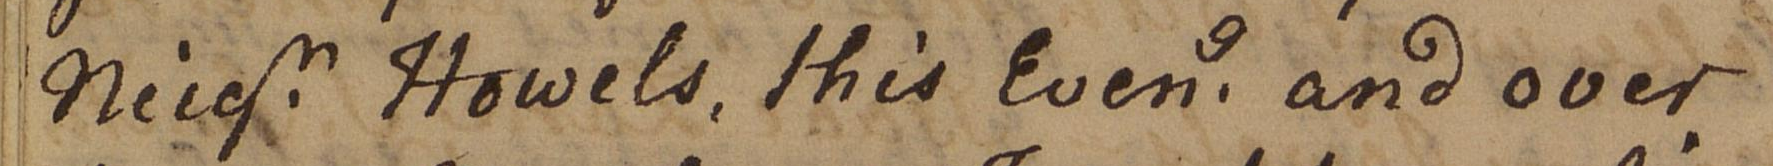Neig^r. Howels, this Even^g. and over
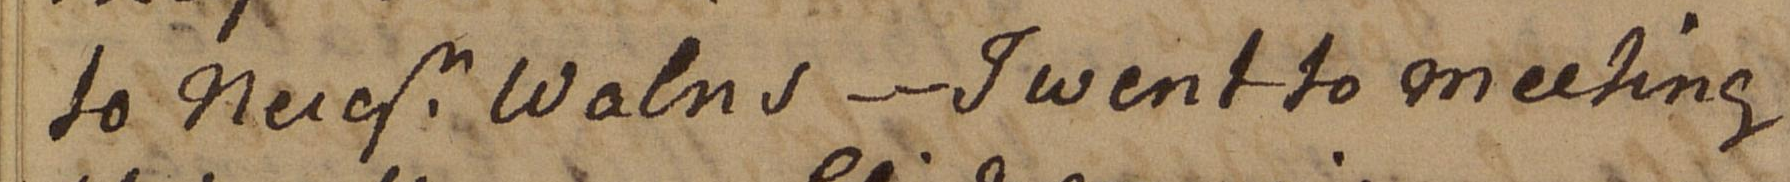to Neig^r. Walns- I went to meeting
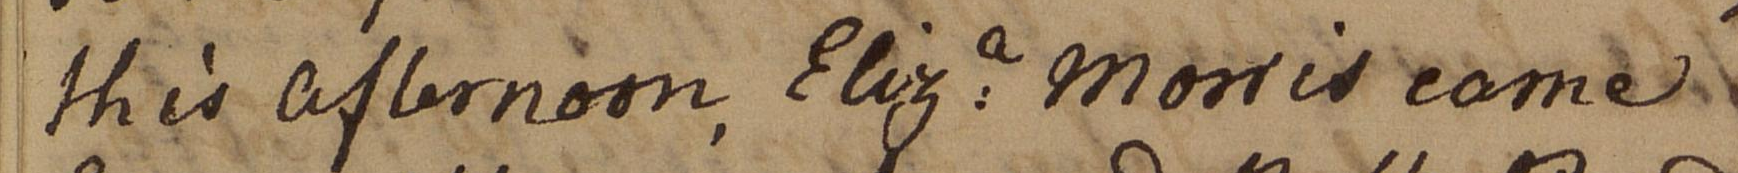this Afternoon, Eliz^a: Morris came
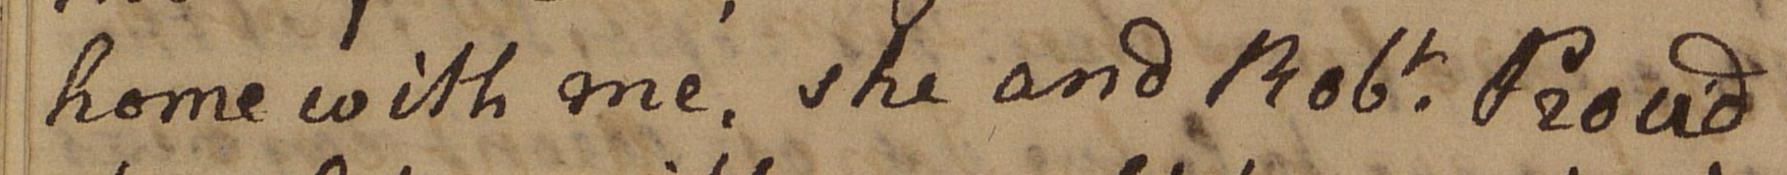home with me, she and Rob^t. Proud
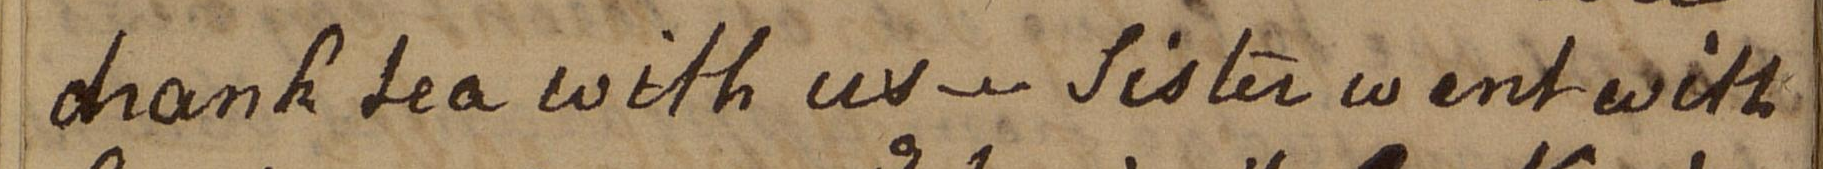drank tea with us- Sister went with
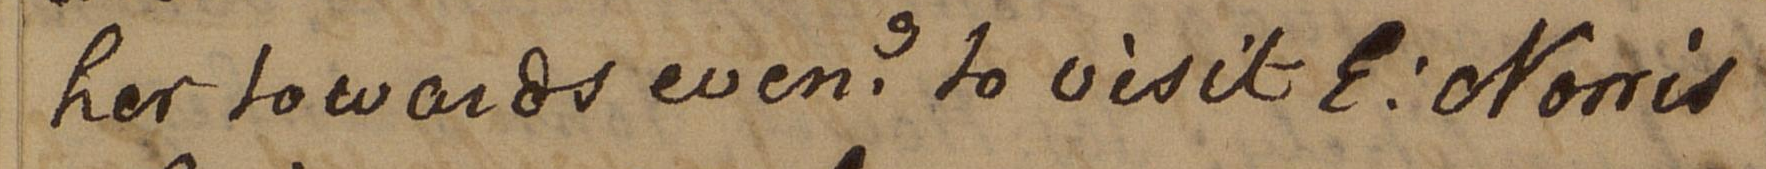her to wards even^g. to visit E: Noris
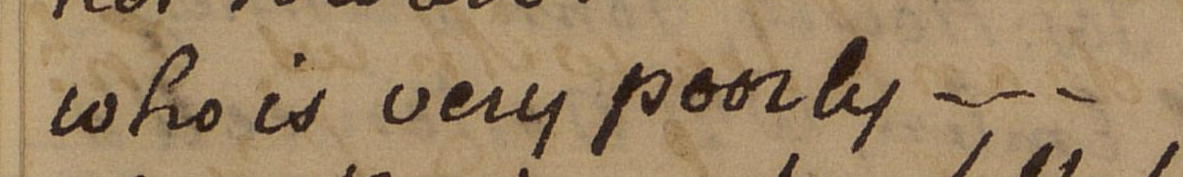who is very poorly--
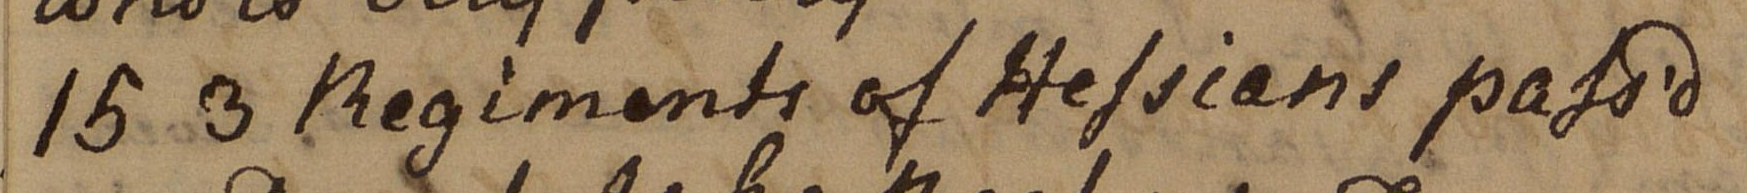15 3 Regiments of Hessians pass'd
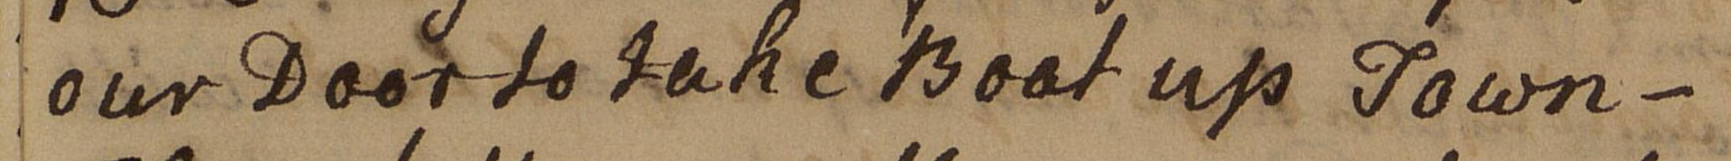our Door to take Boat up Town-
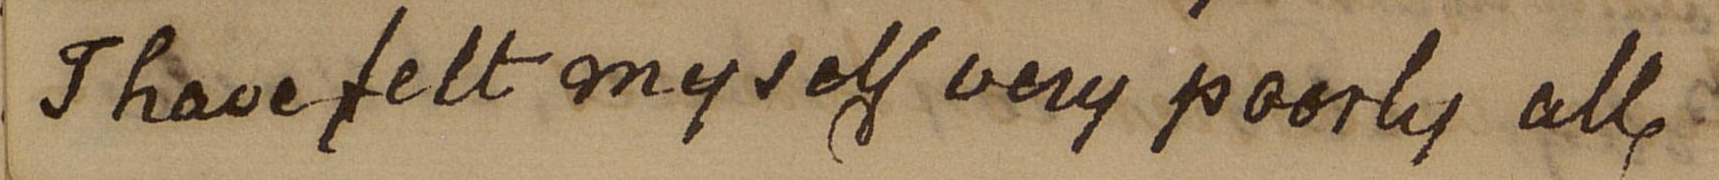I have felt myself very poorly all
